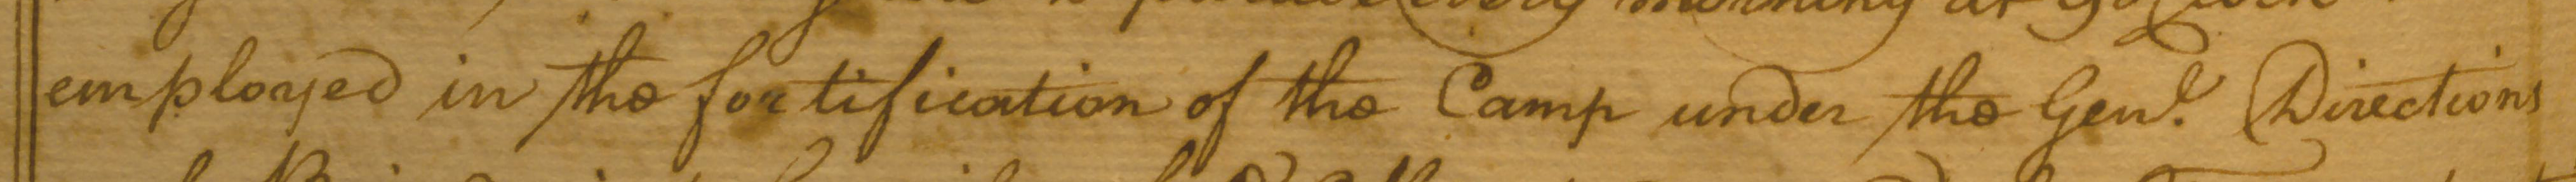employed in the fortification of the Camp under the Gen^l. Directions
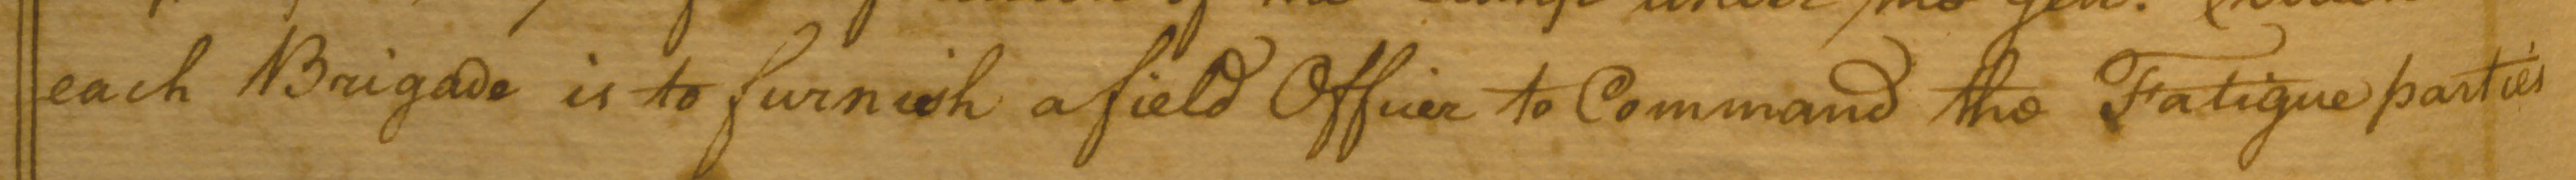each Brigade is to furnish a field Officer to Command the Fatigue parties
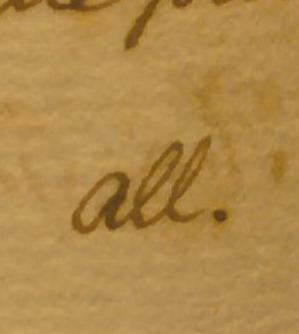all.
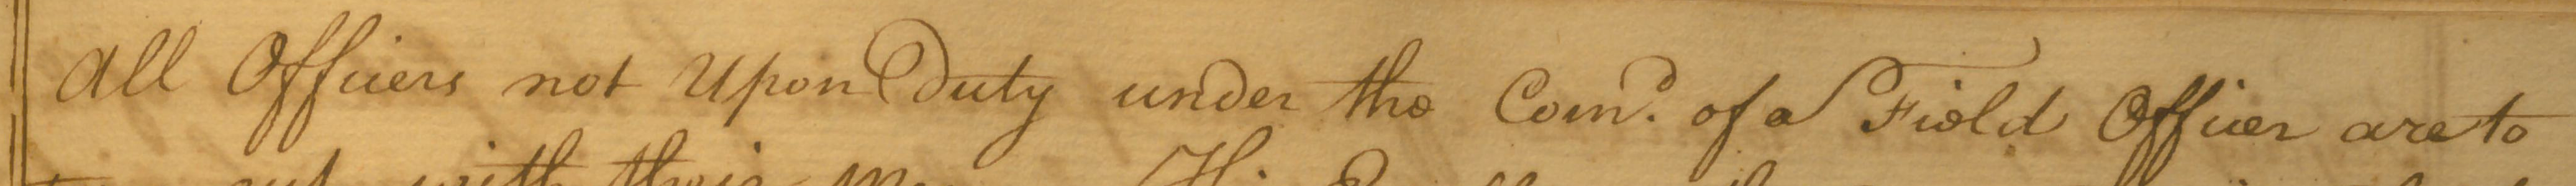All Officers not Upon duty under the Com^d. of a Field Officer are to
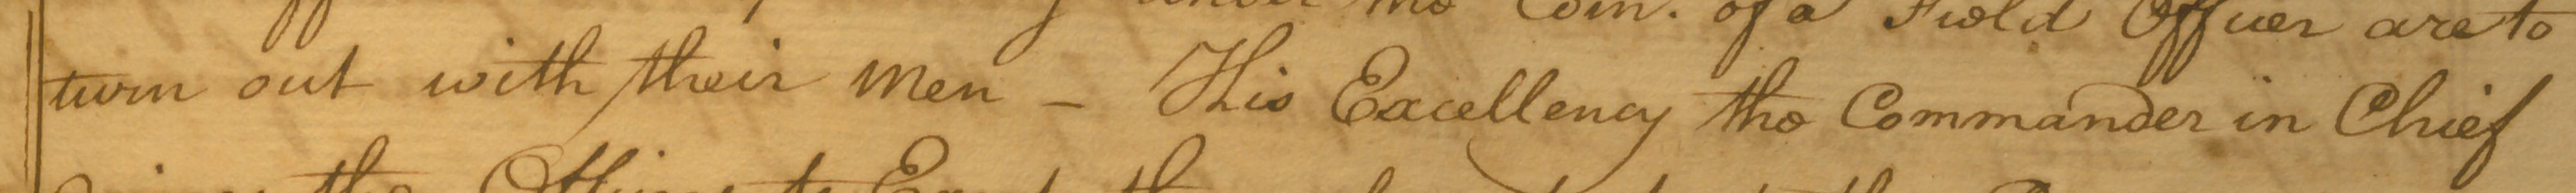turn out with their men- His Excellency the Commander in Chief
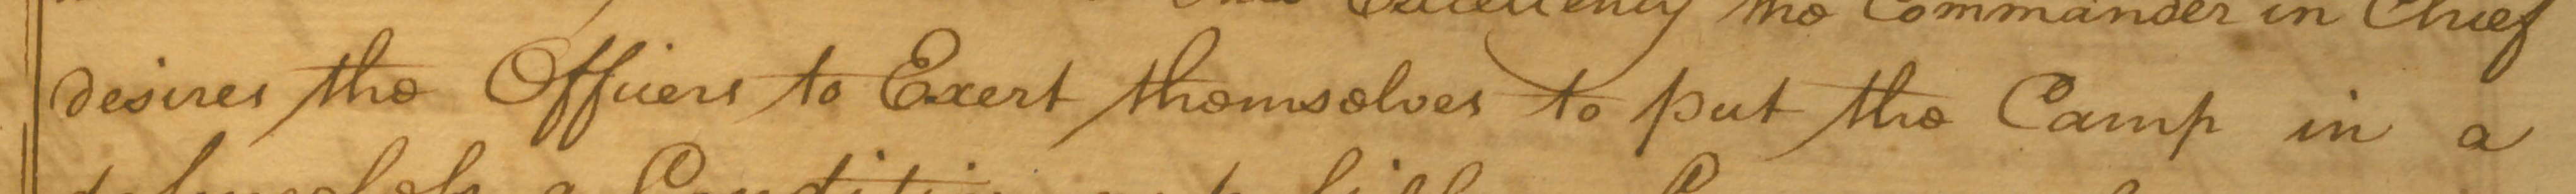desires the Officers to Exert themselves to put the Camp in a
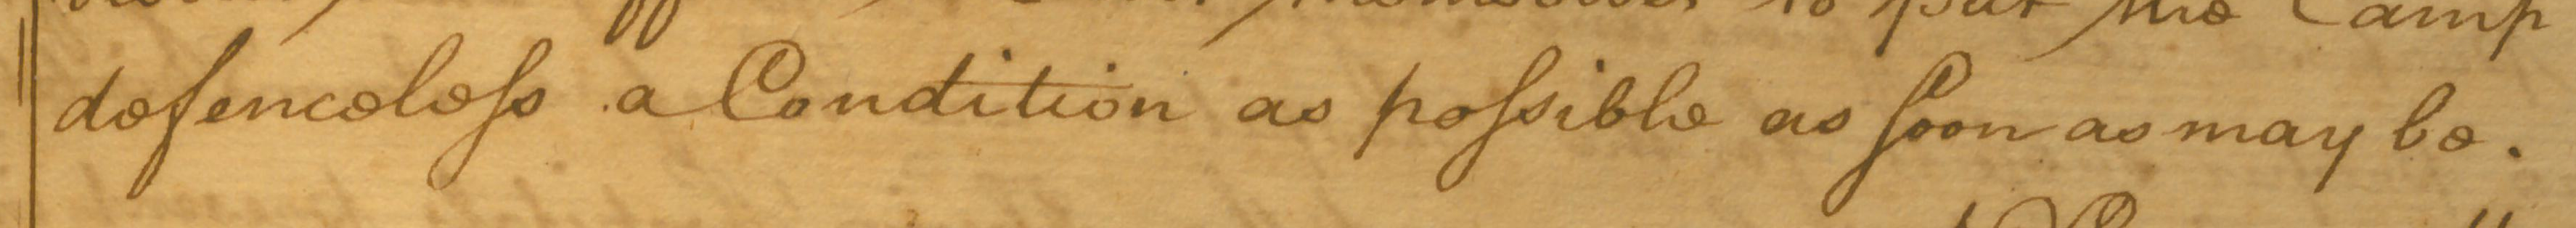defencesless a Condition as possible as soon as may be.
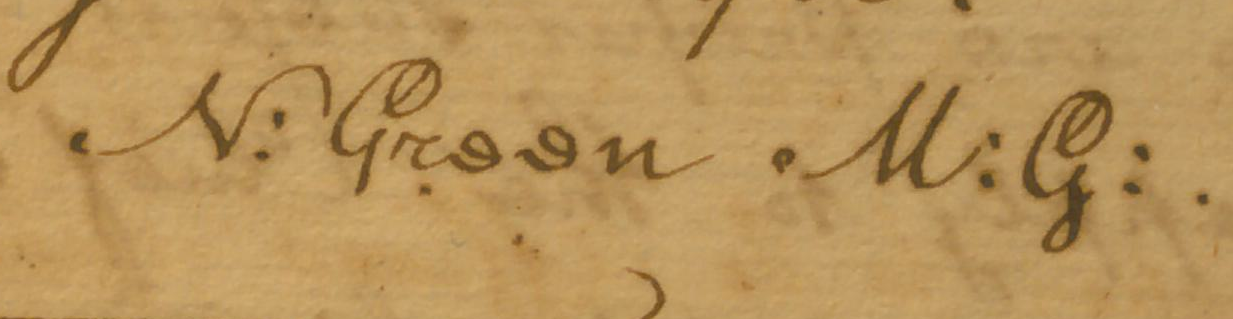N: Green M: G:
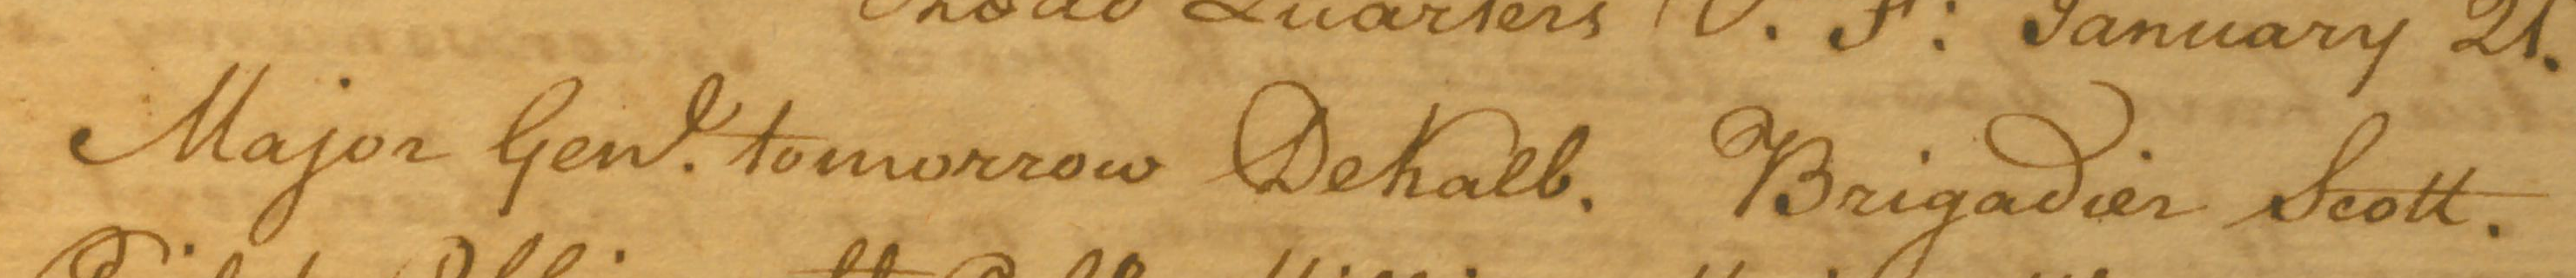Major Gen^l. tomorrow DeKalb. Brigadier Scott.
